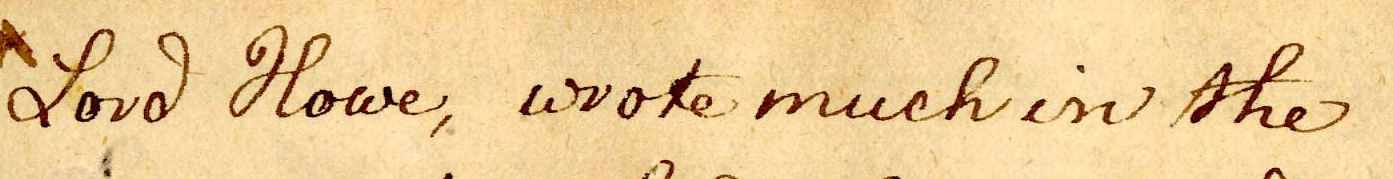Lord Howe, wrote much in the
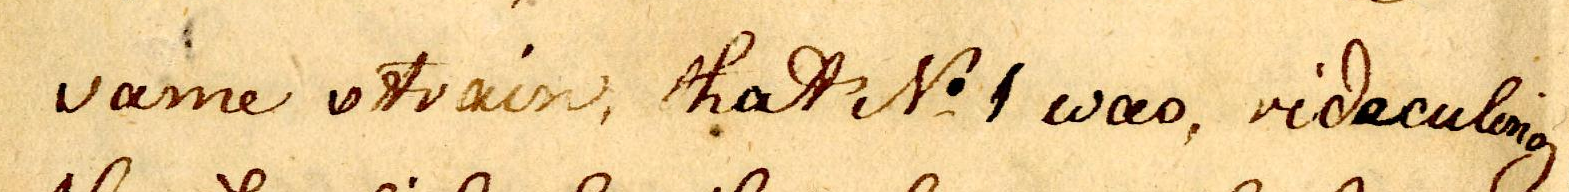same strain, that N^o 1 was, rideculing
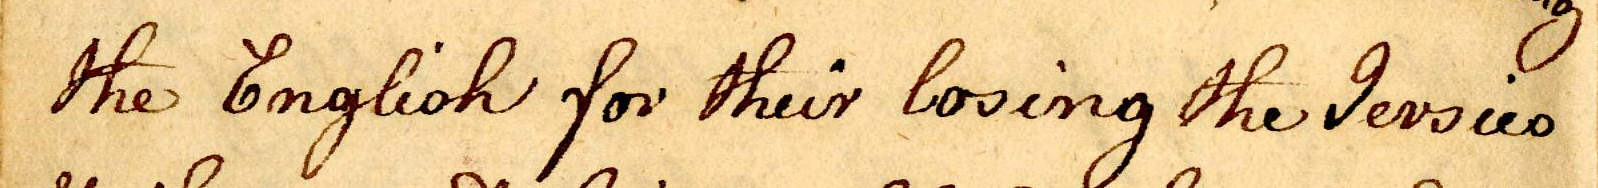the English for their losing the Jersies
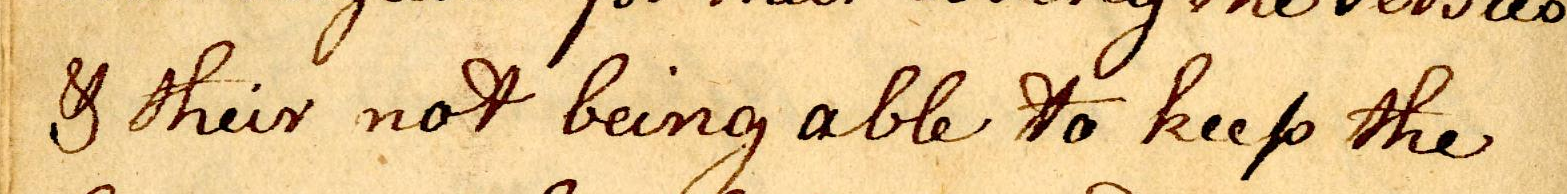& their not being able to keep the
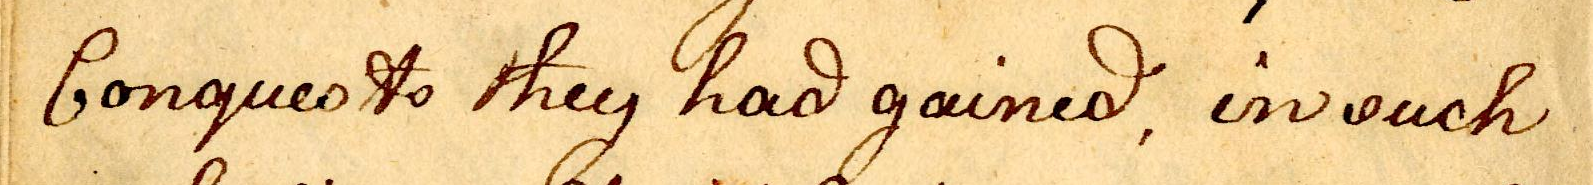Conquests they had gained, in such
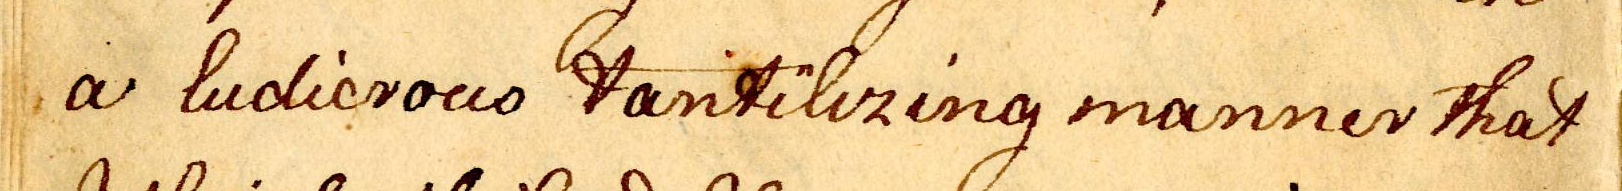a ludicrous tantilizing manner that
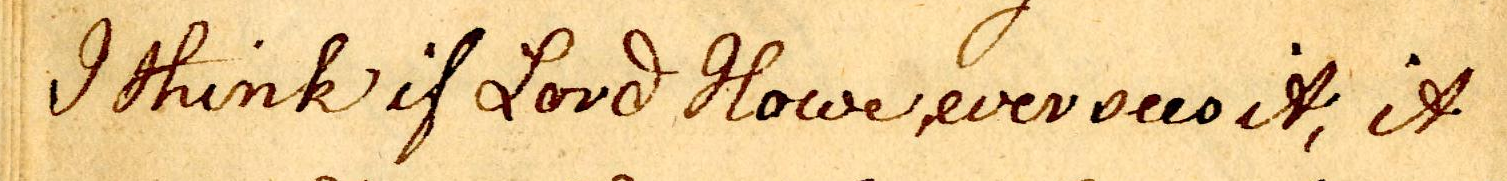I think if Lord Howe ever sees it, it
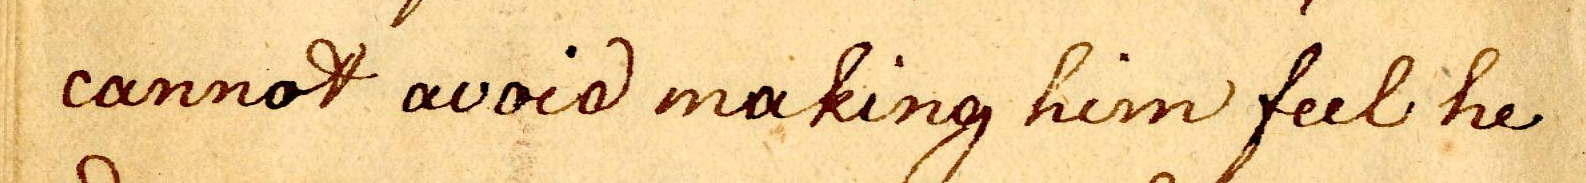cannot avoid making him feel he
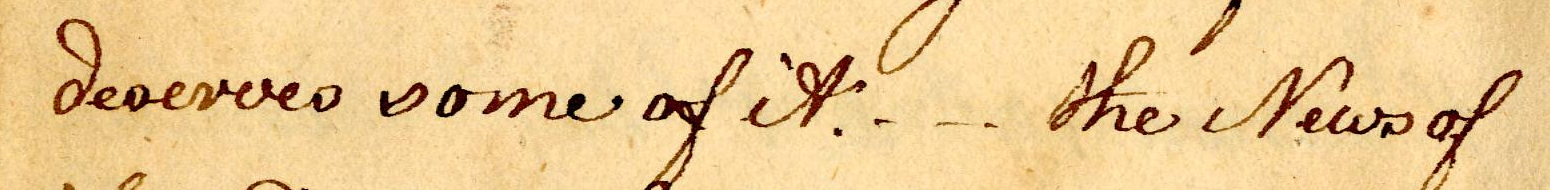deserves some of it.- the News of
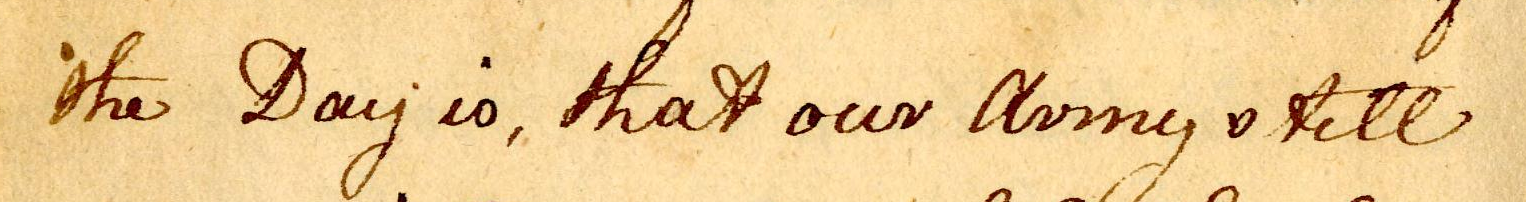the Day is, that our Army still
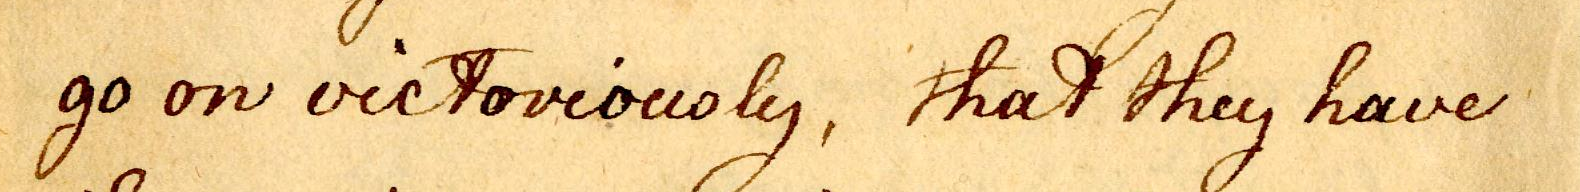go on victoriously, that they have
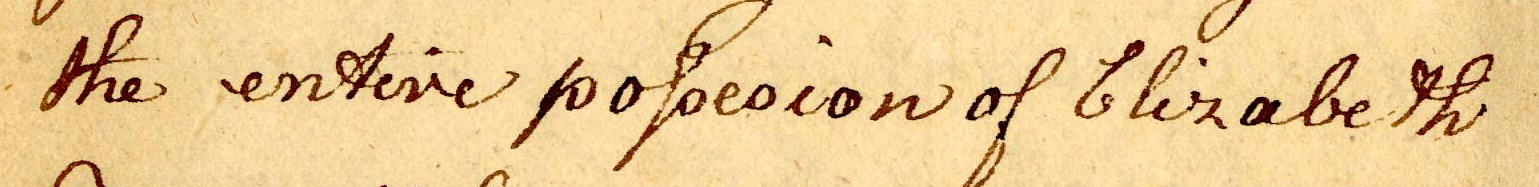the entire possesion of Elizabeth
